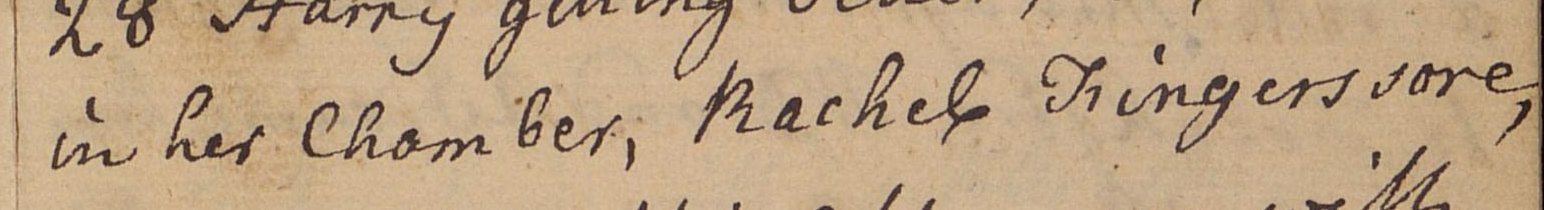in her Chamber, Rachel Fingers sore,
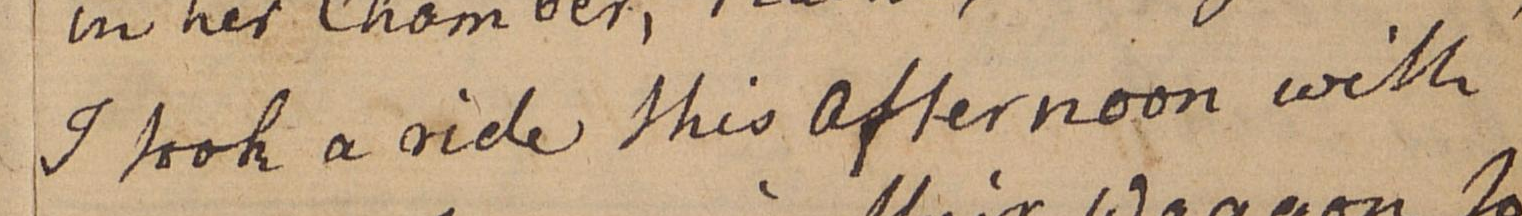I took a ride this Afternoon with
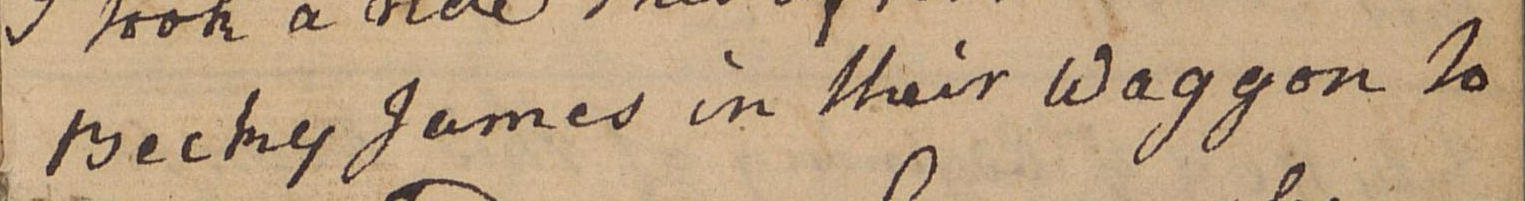Becky James in their Waggon to
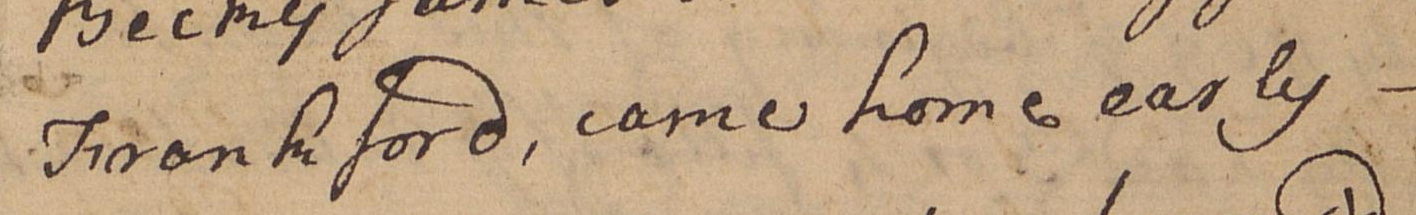Frankford, came home early-
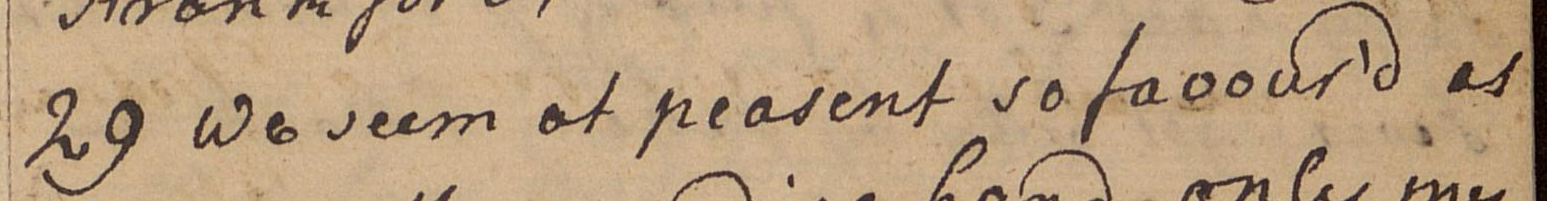29 we seem at peasent so favour'd as
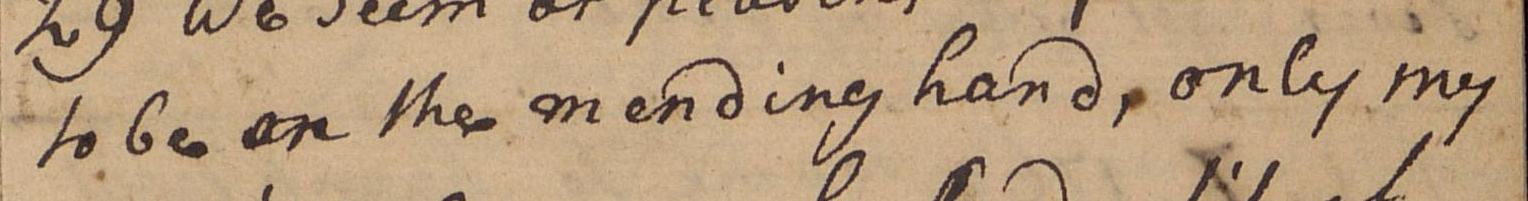to be on the mending hand, only my
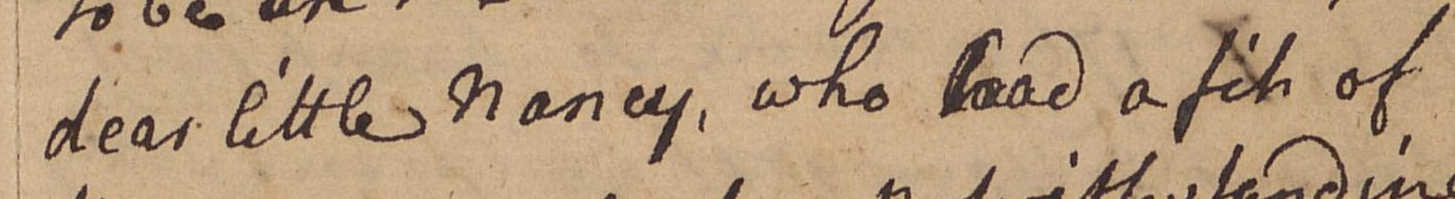dear little Nancy, who had a fit of
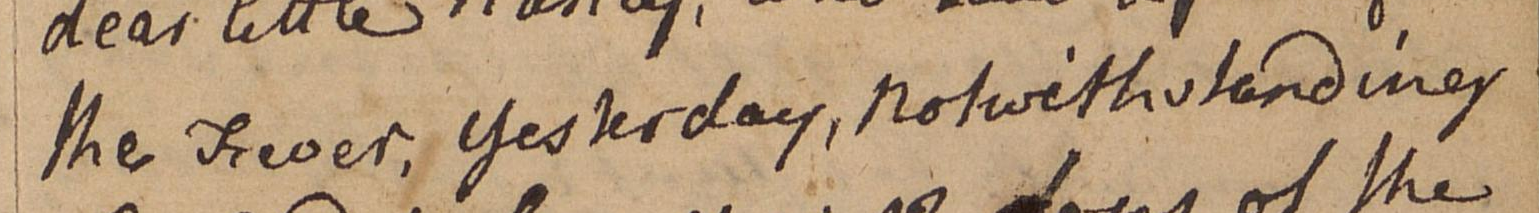the Fever, Yesterday, Notwithstanding
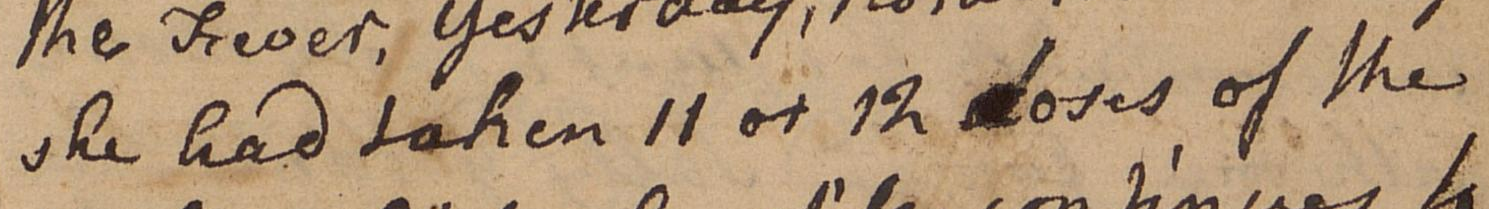she had taken 11 or 12 doses of the
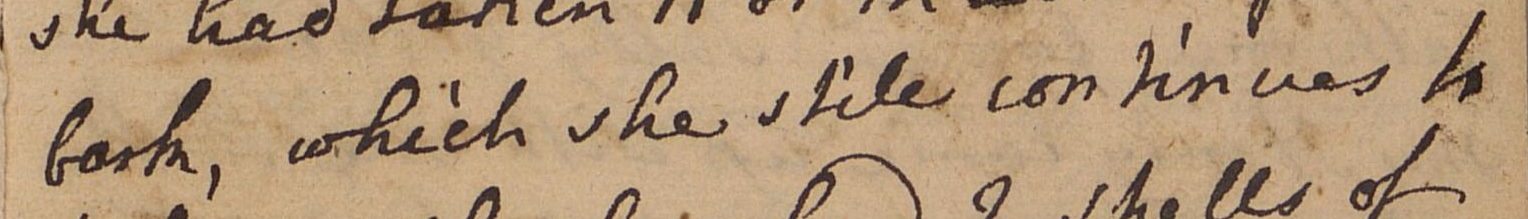bark, which she still continues to
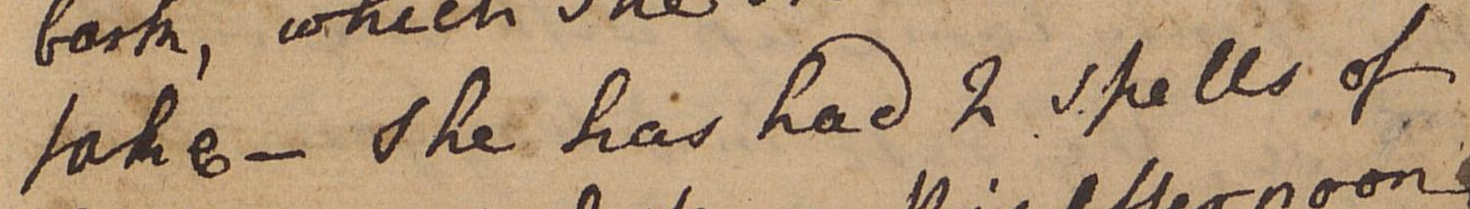take- She has had 2 spells of
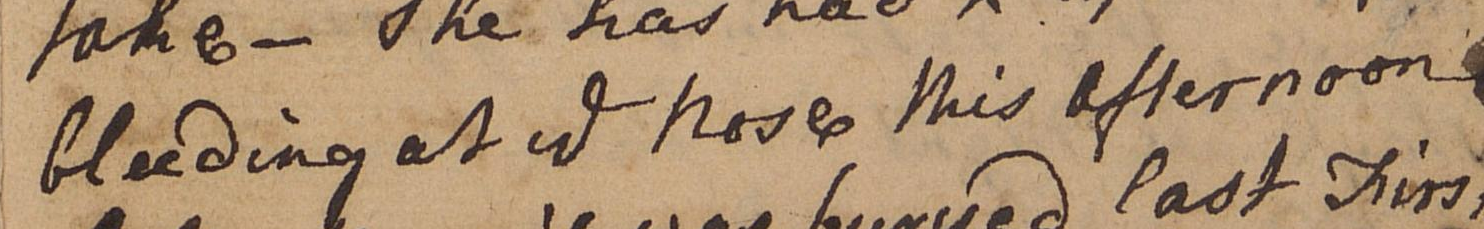bleeding at y^e nose this afternoon
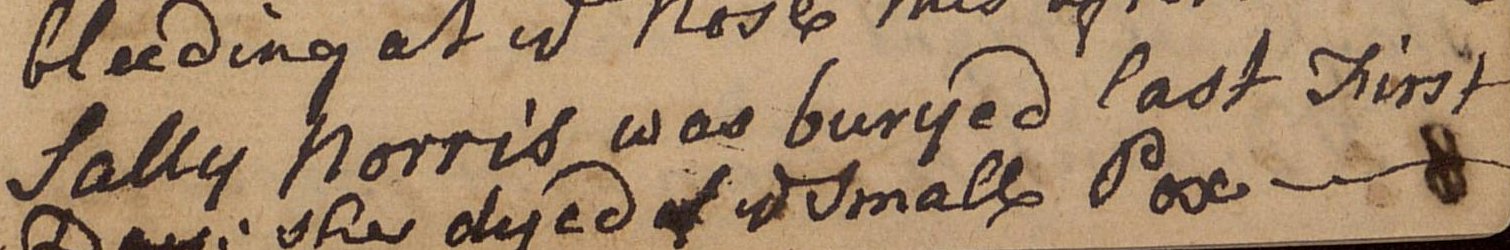Sally Norris was buryed last First
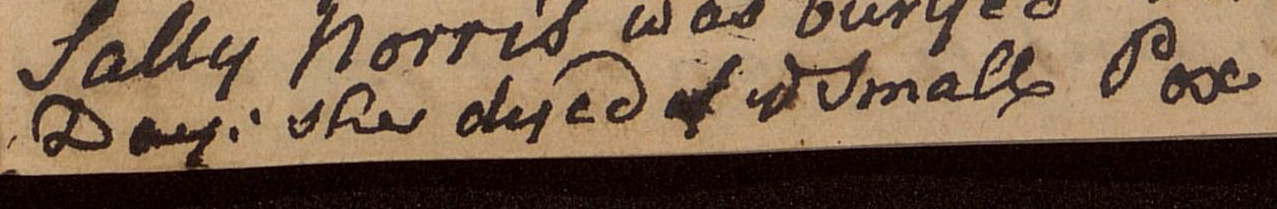Day: she dyed of y^e Small Pox -
